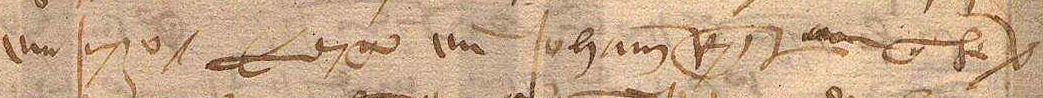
em Jujzo / E djgo eu Joham pj̄z tam q̄ he ꝟ
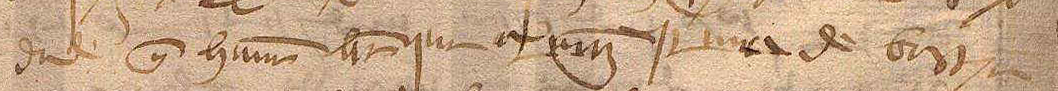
dade q̄ hūua brāqua alur̄rz Jrma de bastjā
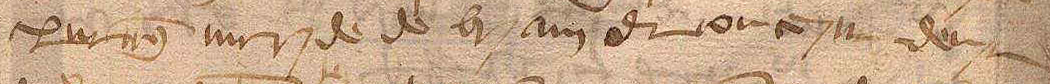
aluarrez marjdo de brjamda coucejrra deuja
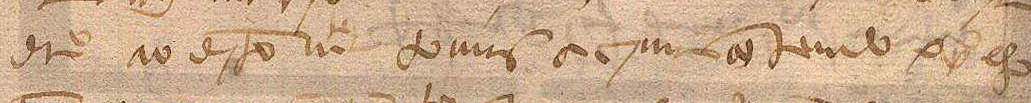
dro ao djto mter tomas acjma cōteudo e p̄o lho
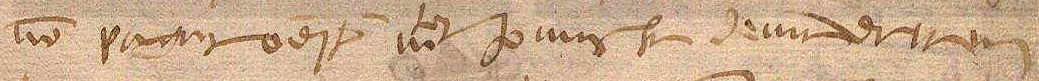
n̄o pagar o djto mter tomas ha demādara em
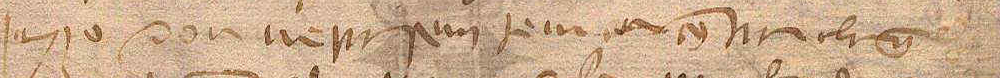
Jujzo e ouuerra semtemça cōtra ela q̄ lhe
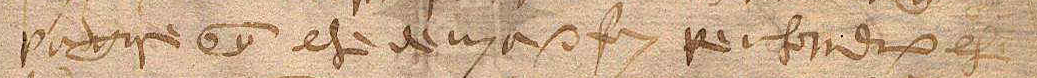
pagase o q̄ lhe deuja e foj penhorada e lhe
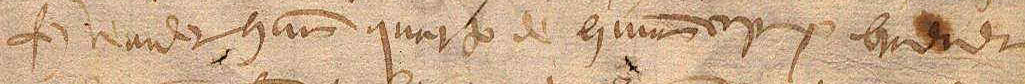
fez vemder huū quarto de huūa casa sobradada
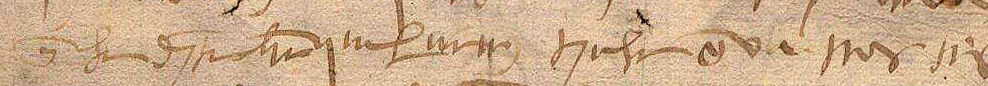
q̄ ha djta br̄aquaLuarrz̄ tjnha c̄o outros tres
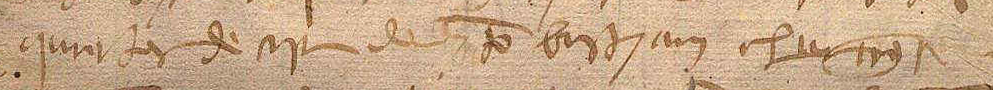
quartos de casa do djto bastjam aLuar̄rz seu
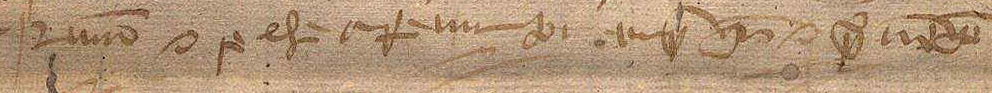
Jrmão e se lhe aRematou em p̄ḡa e p̄o nēgē
